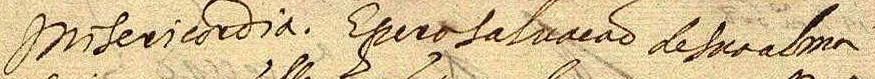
misericordia. E pera saluacão de sua alma
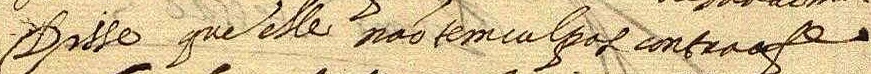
Disse que elle naõ tem culpas contra a fe
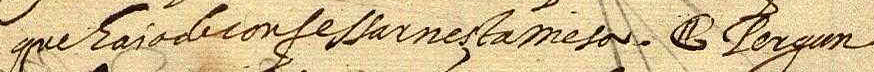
que haia de confessar nesta mesa. ¶ Pergun
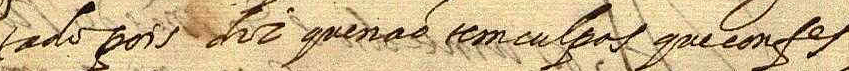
tado pois diz que naõ tem culpas que confes
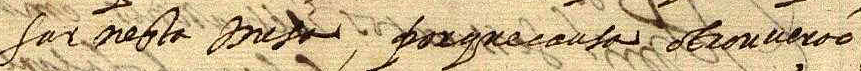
sar nesta mesa, porque causa o trouxeraõ
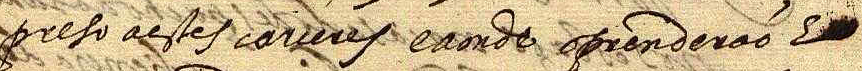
preso a estes carceres e aonde o prenderaõ E
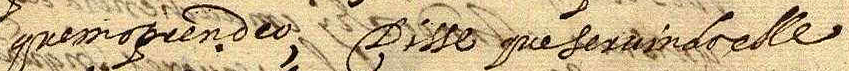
quem o prendeo, Disse que seruindo elle
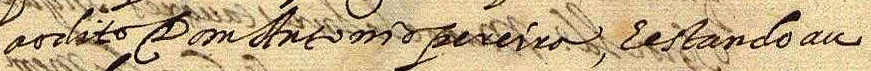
ao dito Dom Antonio pereira, E estando au
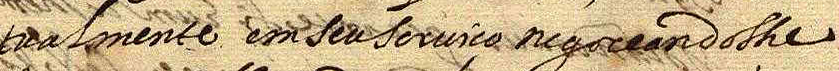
tualmente em seu seruiço negoceandolhe
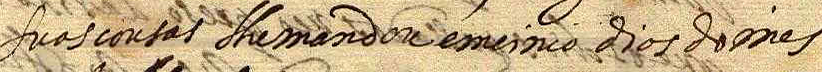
suas cousas lhe mandou em cinco dias do mes
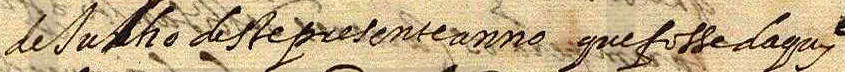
de Iulho deste presente anno que fosse daquy
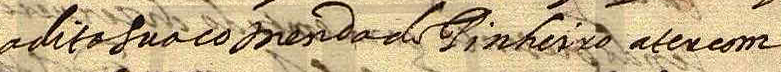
a dita sua comenda do Pinheiro a ter com
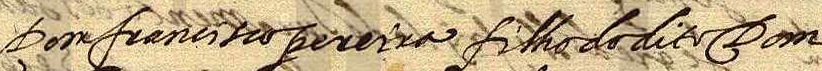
Dom francisco pereira filho do dito Dom
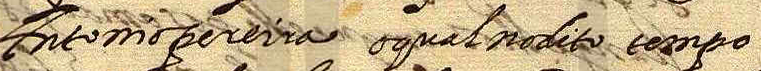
Antonio pereira o qual no dito tempo
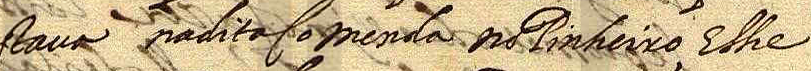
estaua na dita Comenda no Pinheiro, E lhe
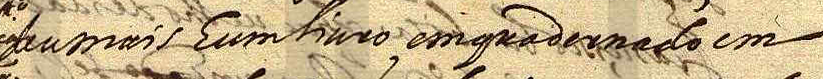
deu mais hum liuro emquadernado em
